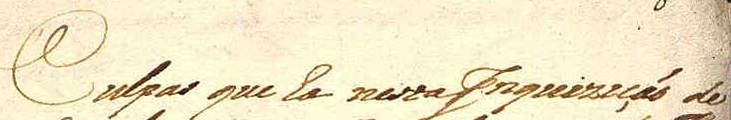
Culpas que ha nesta Jnquizição de
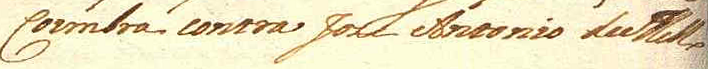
Coimbra contra Joze Antonio de Mello
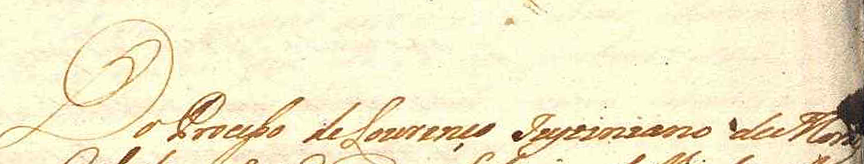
Do Processo de Lourenço Iustiniano de Moraes
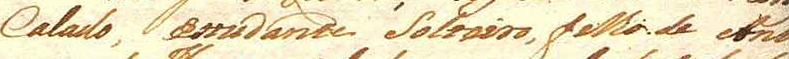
Calado, estudante solteiro, filho de Anto
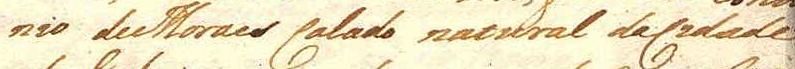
nio de Moraes Calado natural da Cidade
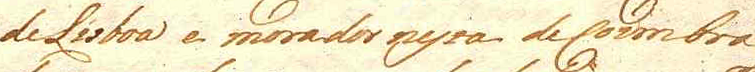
de Lisboa e morador nesta de Coimbra
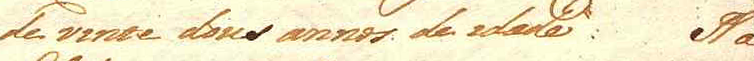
de vinte dous annos de idade. Na
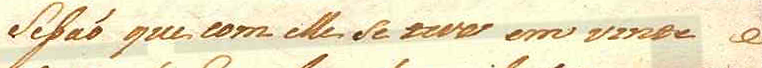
sessaõ que com elle se teve em vinte e
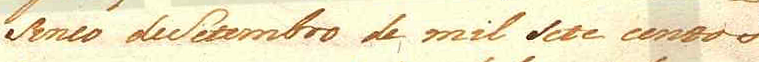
senco de Setembro de mil setecentos
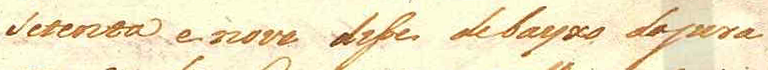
setenta e nove disse debayxo do jura
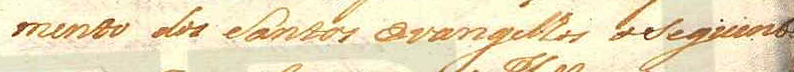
mento dos Santos Evangelhos o seguinte
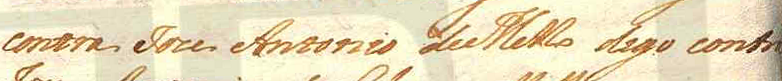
contra Ioze Antonio de Mello digo contr_
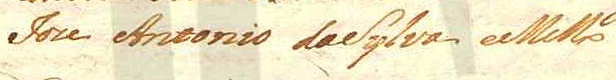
Ioze Antonio da Sylva e Mello
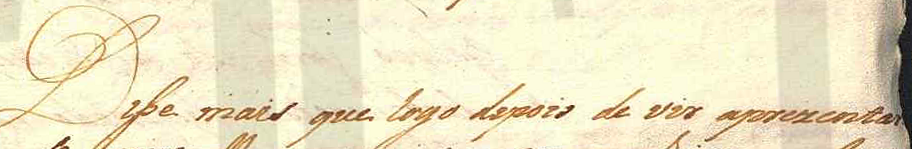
Disse mais que logo depois de vir aprezentar
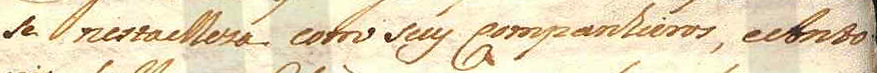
se nesta Meza com seus Companheiros, e Anto
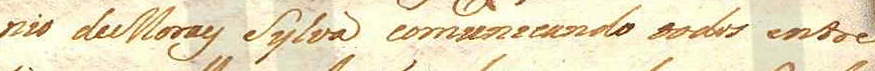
nio de Moraes Sylva comunicando todos entre
